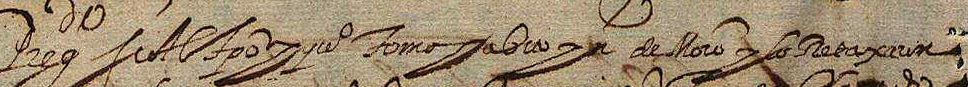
Pregdo si Al tpō y quo tomo habito y ne de Moro y lo Retaxaron
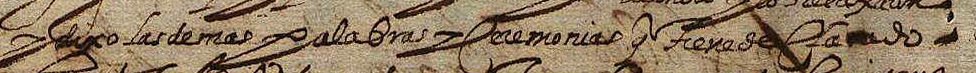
y dixo las demas palabras y Ceremonias q̄ tiene deClarado
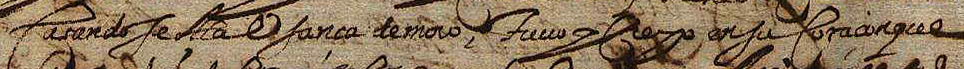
Casandose A la Vsança de moro, tuuo y Creyo en su Coraçon que
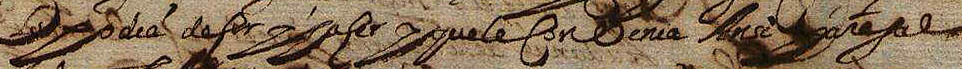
lo podia dezir y hazer y que le Convenia Ansi para sal
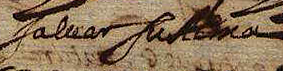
saluar su Alma
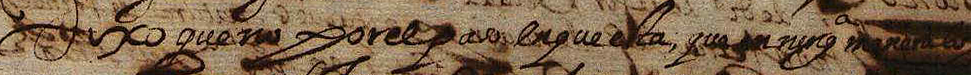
Dixo que no por el paso en que esta, que en ninga manera lo
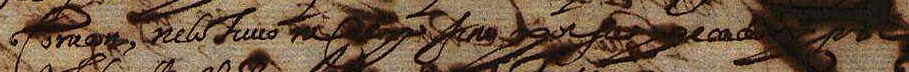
Coraçon ne lo tuuo ne Creyo sino por sus pecados y por
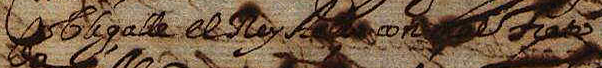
obligalle el Rey A ello con maltrato
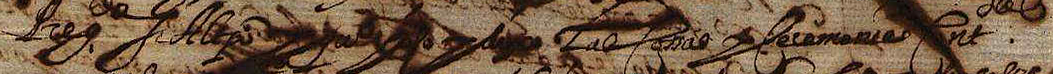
Preg.do si Al tpō que hizo y dixo las Cossas y Ceremonias Cont.das
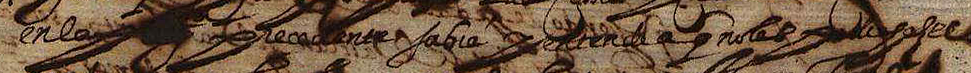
en la pregta precedente sabia y entendia q̄ no les pode hazer
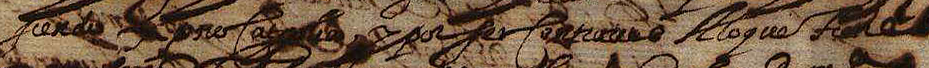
siendo xpno Catholico, y por ser Contrarias A lo que tiene
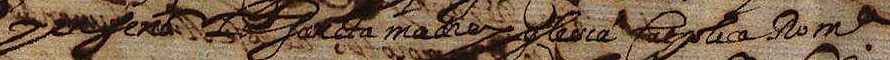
y ensenā la sancta madre yglesia Catholica Roma
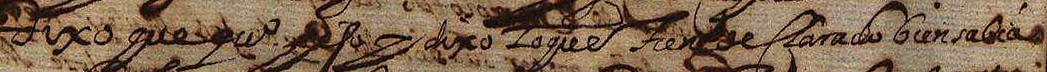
Dixo que qu.o hizo y dixo lo que tiene deClarado bien sabia
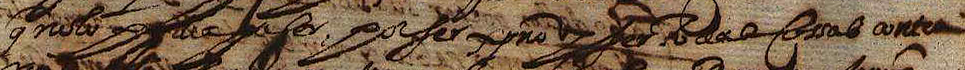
q̄ no lo podia hazer, por ser xpn̄o y por todas Cossas contra
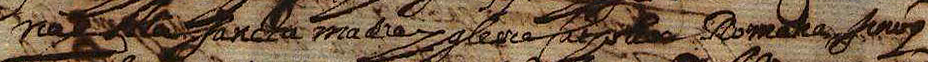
rias A la sancta madre yglesia Catholica Romana sino q̄
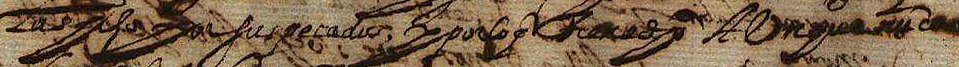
las hizo por sus pecados, y por lo q̄ tiene dhō AVnque nūca
